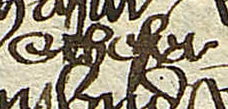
Schefer
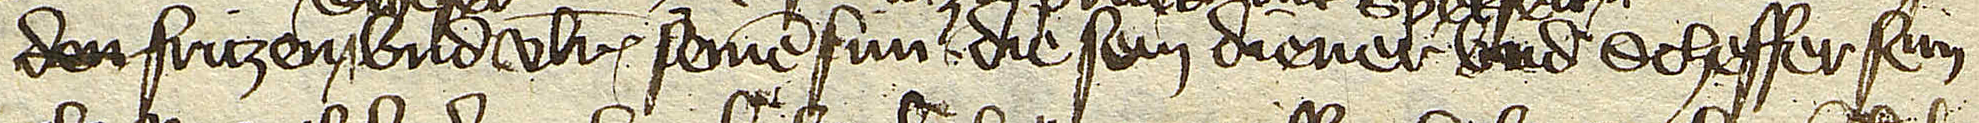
den Fricʒen vnd clr* ſeine* ſün die ſein diener vnd Scheffer ſein
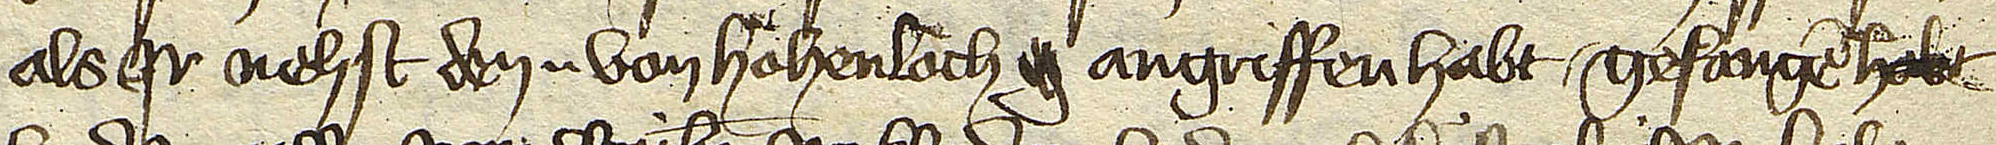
als Ir nehſt den ~ von hohenloch g angriffen habt / gefange* habt
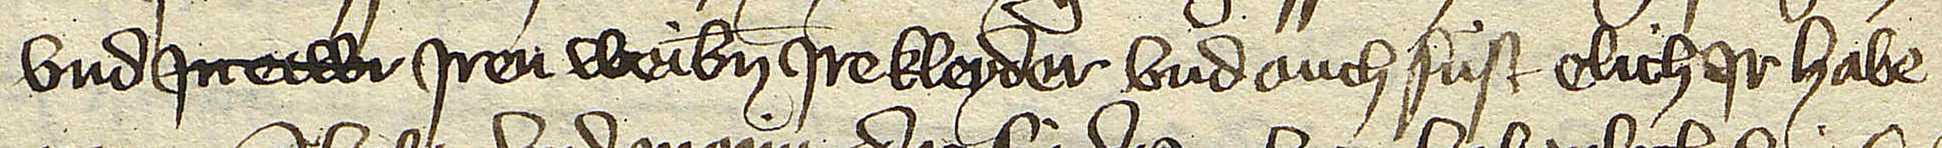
vnd In etwi Iren weibn* Ire kleyder vnd auch ſüſt elich Ir habe
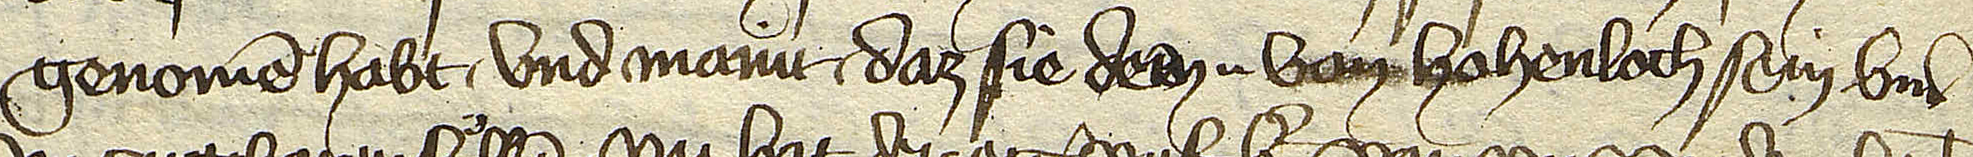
genome* habt / vnd maint / daʒ ſie dem ~ von Hohenloch ſein vnd
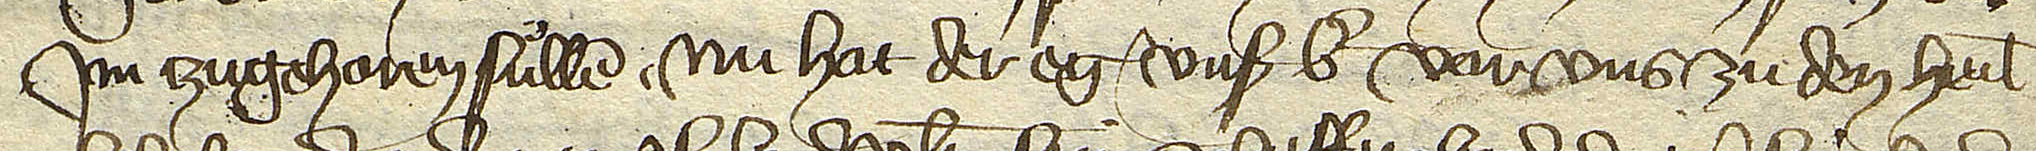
Im cʒugehoren ſülle* / Nu hat der eg* vnſ* b* vor vns cʒu den heil*
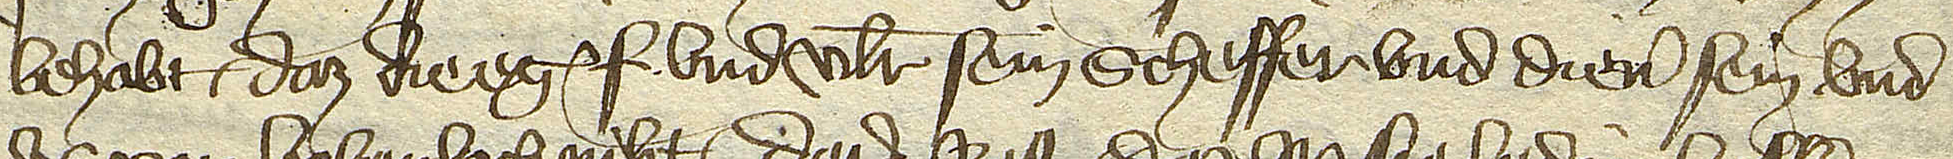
behabt / daʒ die eg* f vnd vlr* ſein Scheffer vnd dien* ſein vnd
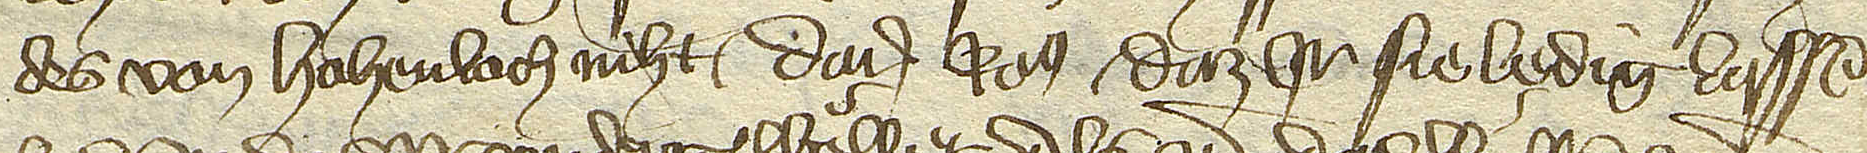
des von hohenloch niht / Dar* Ro* / daʒ Ir ſie ledig laſſe*
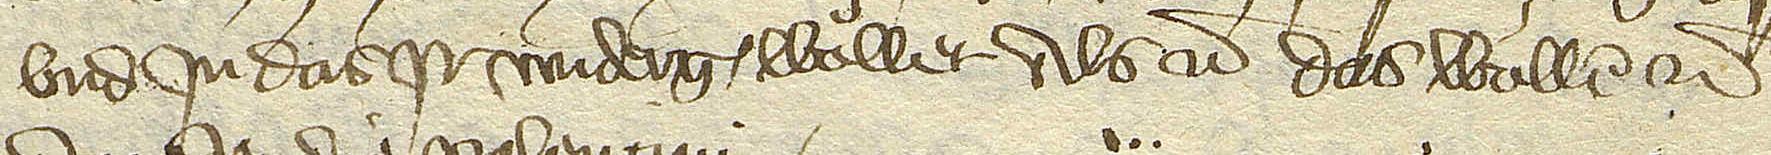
vnd In das Ir widerg* wöllet Als ec* das wölle* ec*
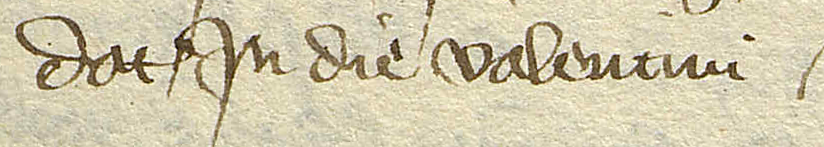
Dat* In die Valentini /
